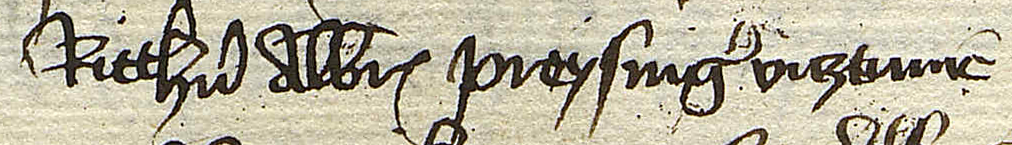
Ritt* h*n Albr* preyſing* vicʒtume*
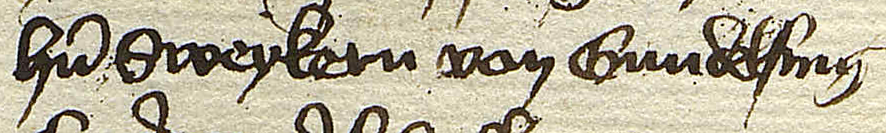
h*n Sweykern von Gundelfing*
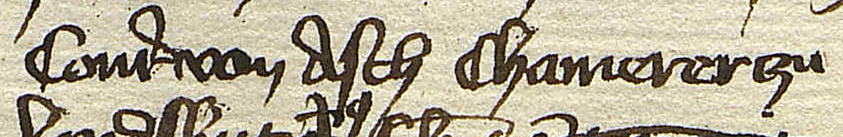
Conr* von Aſch Chamerer cʒu
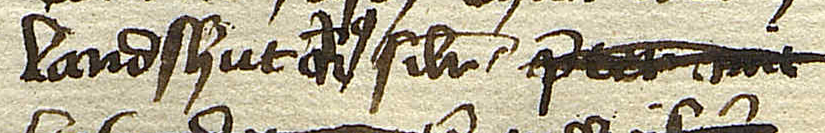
landſhut %% ſilr* / p*ter mit
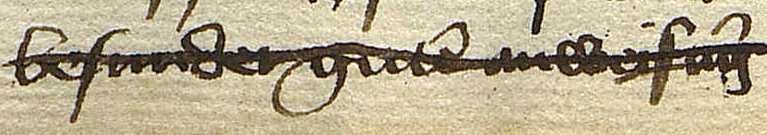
beſunder gute* anweiſu*g
